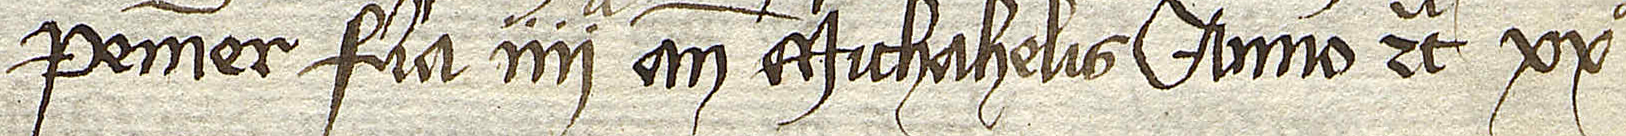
Pemer fi*a iiii* an* Michahelis Anno ec* xx*
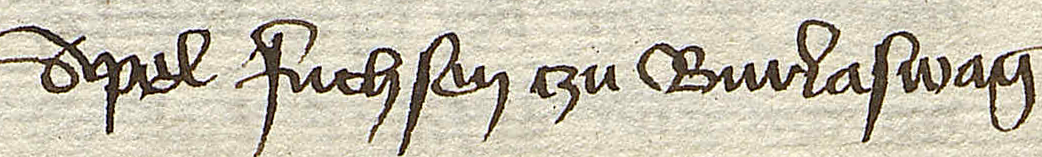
Apel Fuchſen cʒu Burlaſwag
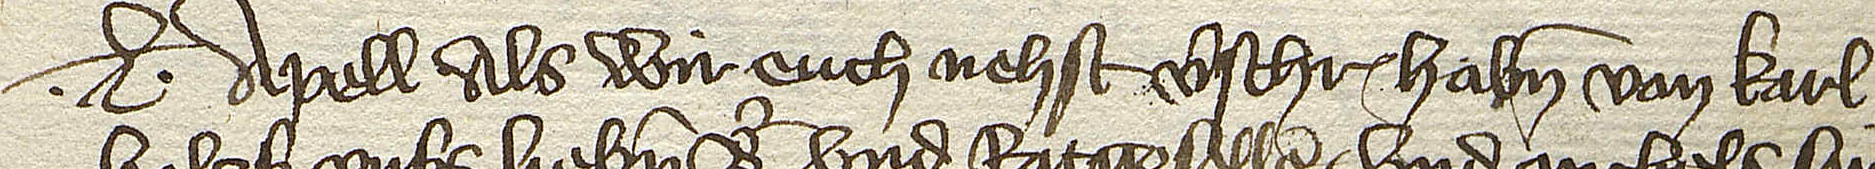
. L* . Apell Als wir euch nehſt v*ſchr* habn* von Karl
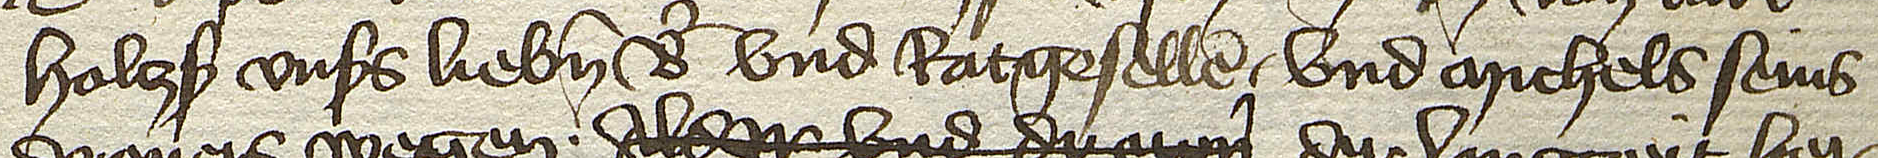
holcʒſ* vnſ*s liebn* B* vnd Ratgeſelle* / vnd Michels ſeins
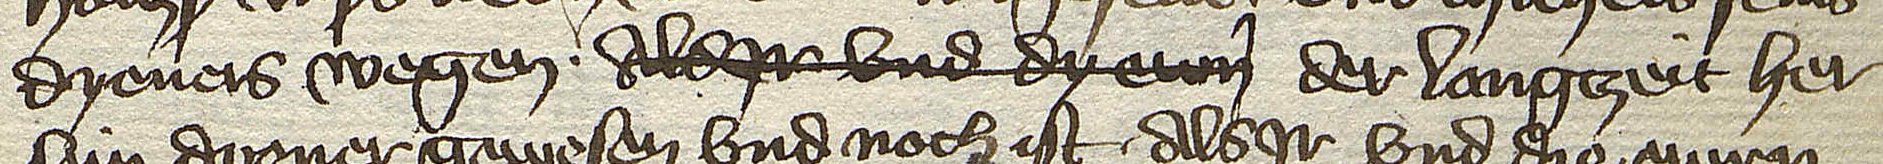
dyeners wegen . Als Ir vns dy ewn* der langcʒeit her
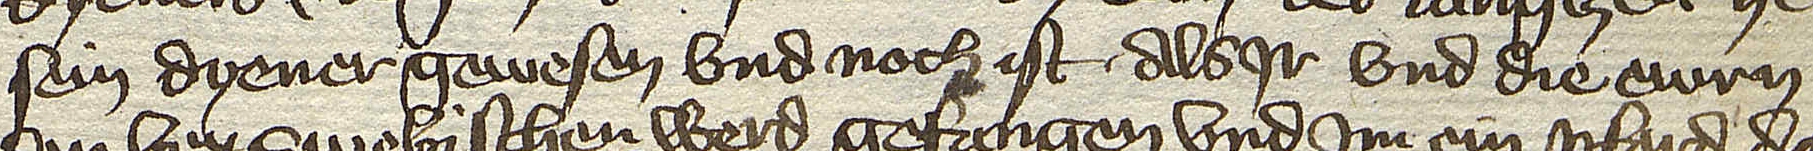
ſein dyener geweſen vnd noch iſt / Als Ir vnd die ewrn
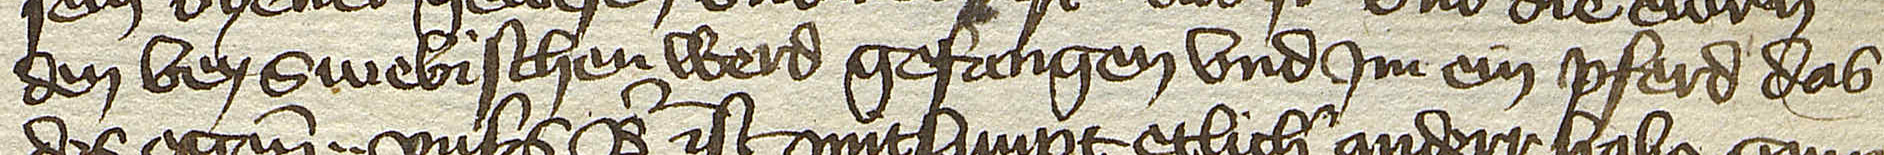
den bey Swebiſchen werd gefangen vnd Im ein pferd das
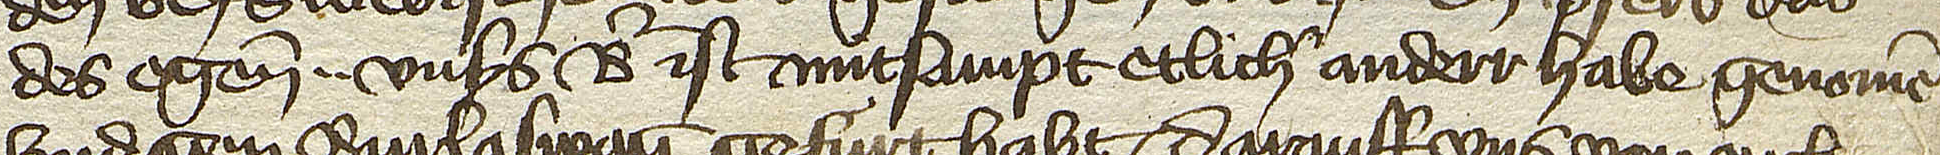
des egen* ~ vnſ*s B* iſt mitſampt etlich* anderr habe genome*
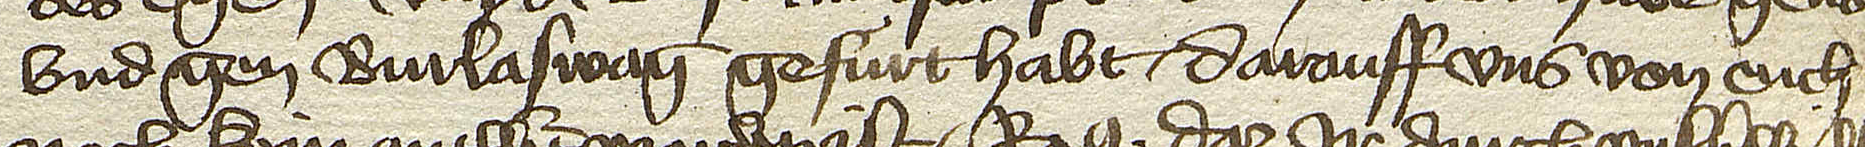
vnd gen Burlaſwag gefürt habt / Darauff vns von euch
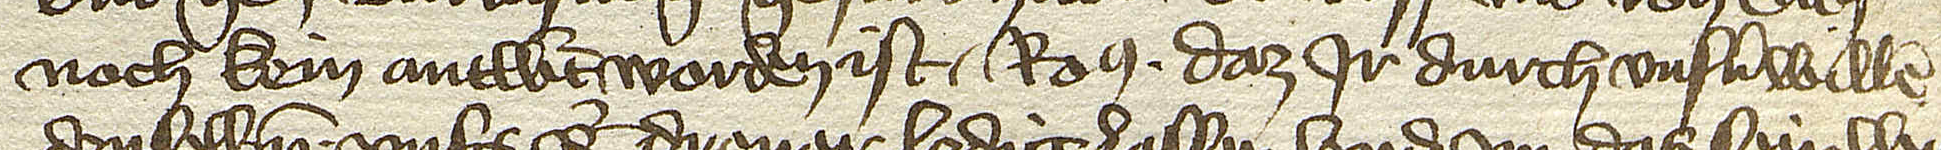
noch kein antw*t worden iſt / Ro* . daʒ Ir durch vnſn* wille*
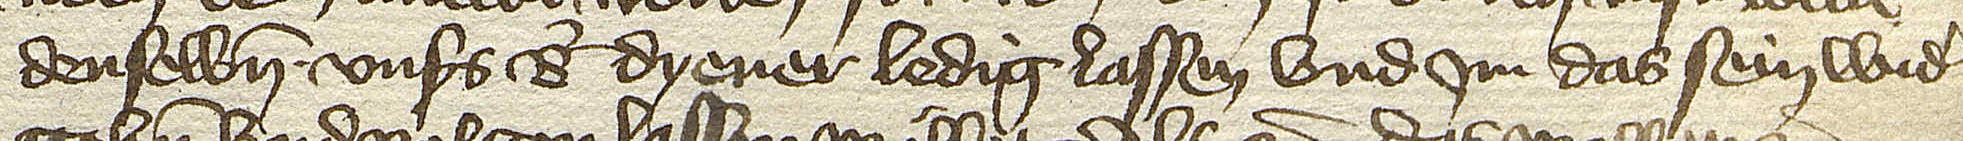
denſelbn* . vnſ*s B* dyener ledig laſſen vnd Im das ſein wid*
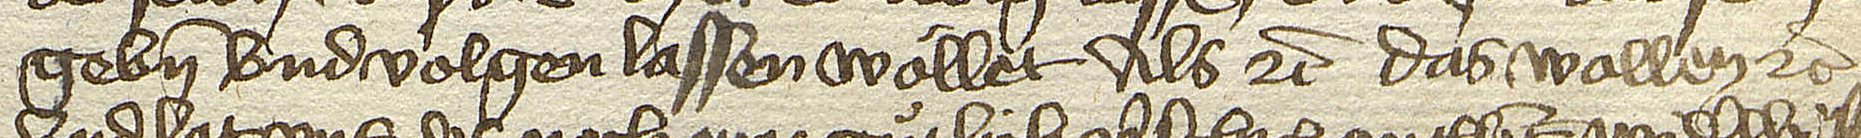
gebn* vnd volgen laſſen wöllet Als ec* das wollen ec*
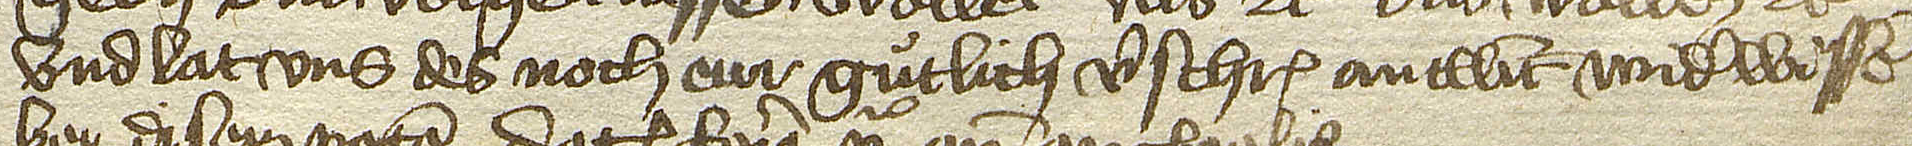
vnd lat vns des noch ewr gütlich v*ſchr* antw*t wid*wiſſe*
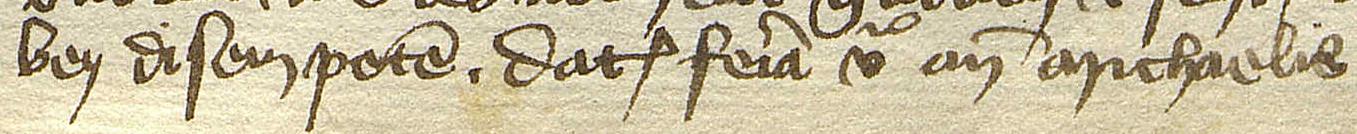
bey diſem pote* . Dat* fei*a v* an* Michaelis
